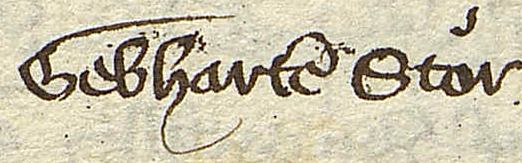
Gebharte* Stör
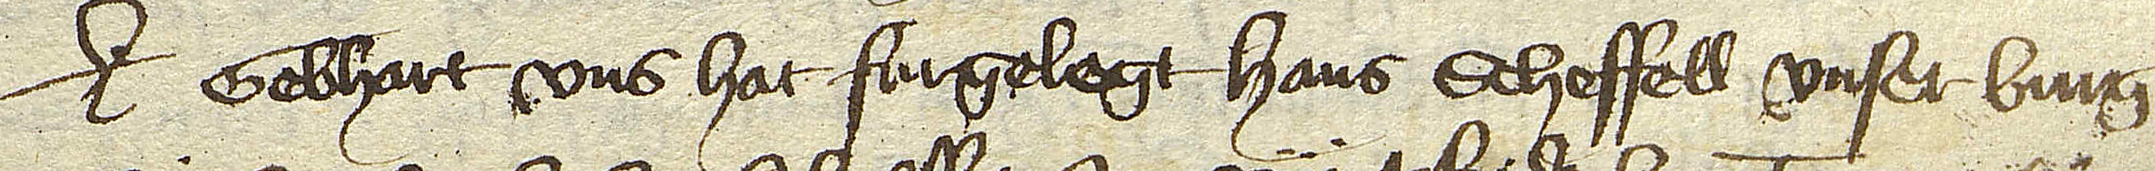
L* Gebhart vns hat furgelegt hans Scheffell vnſer burg*
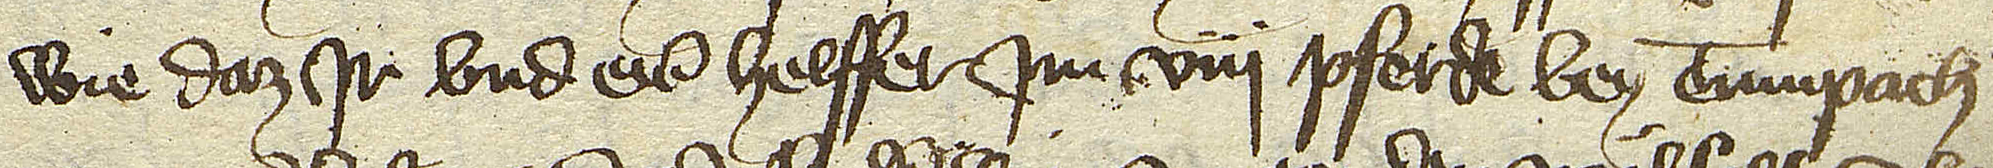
wie daʒ Ir vnd ew* helffer Im viii* pferde bey Tumpach
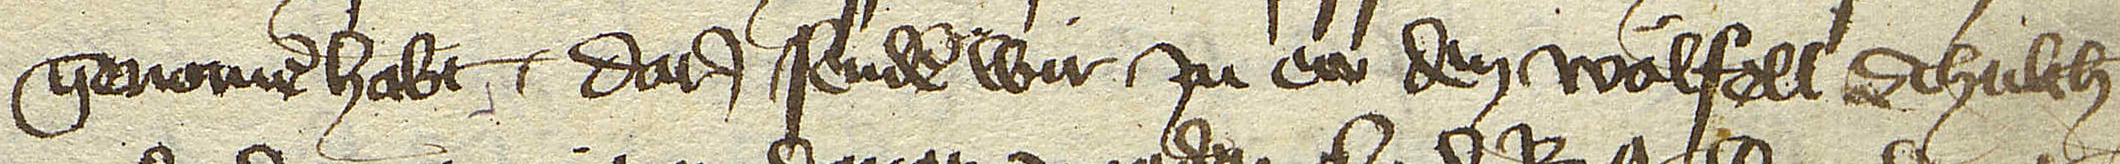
genome* habt / dar* ſende* wir cʒu ew den wölfell Schulth*
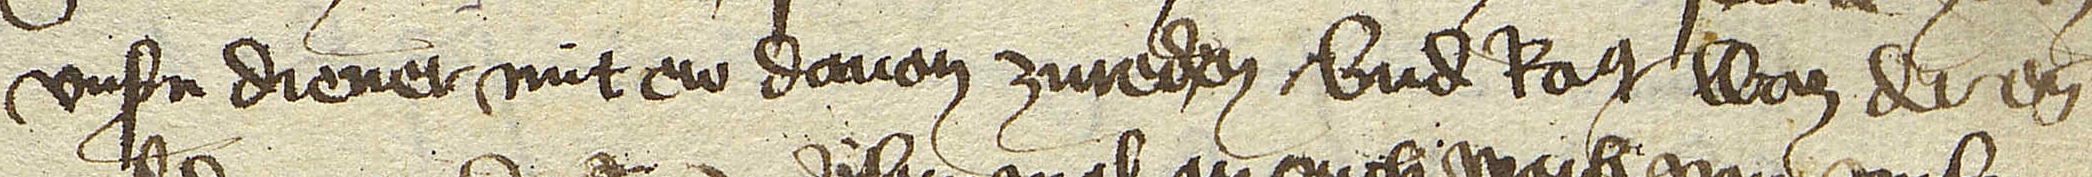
vnſ*n diener mit ew dauon ʒureden / vnd Ro* / waʒ der eg*
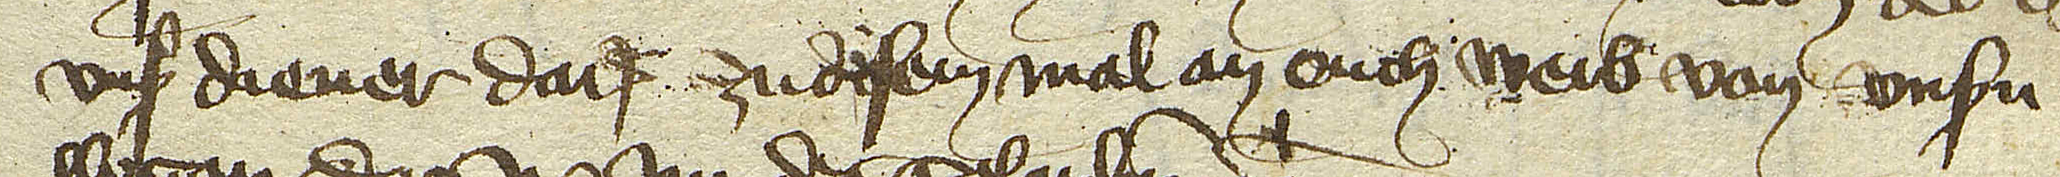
vnſ* diener dar* ʒu diſem mal an euch weis von vnſ*n
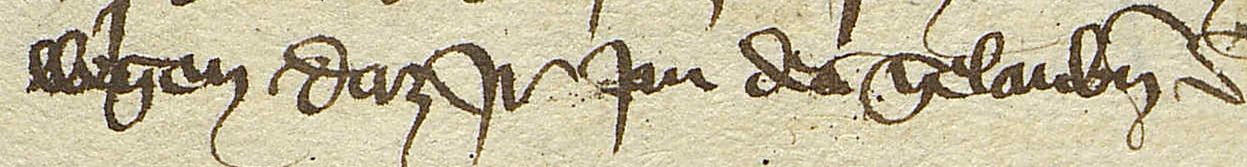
wegen / daʒ Ir Im des gelaubn* §
